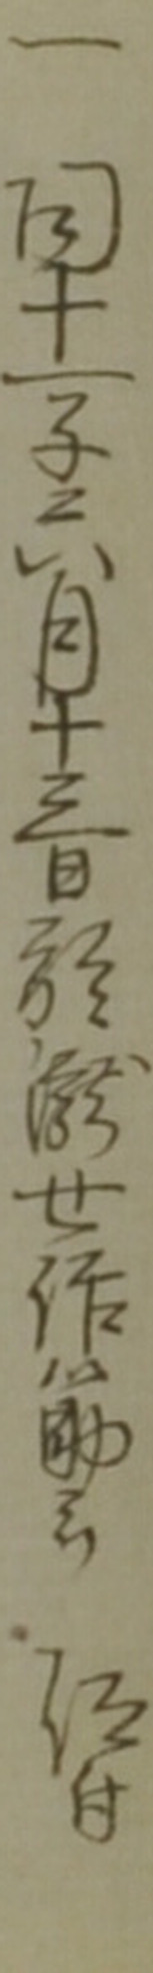一同十一子六月十三日於瀧世話筋被仰付

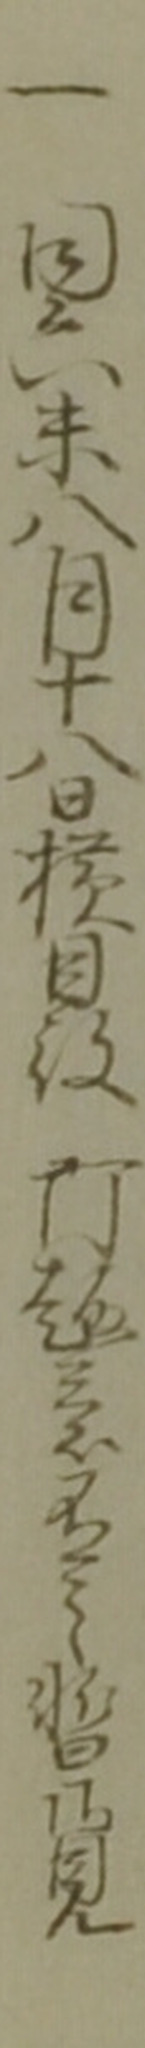一同六未八月十八日横目役御趣意有之暫御見
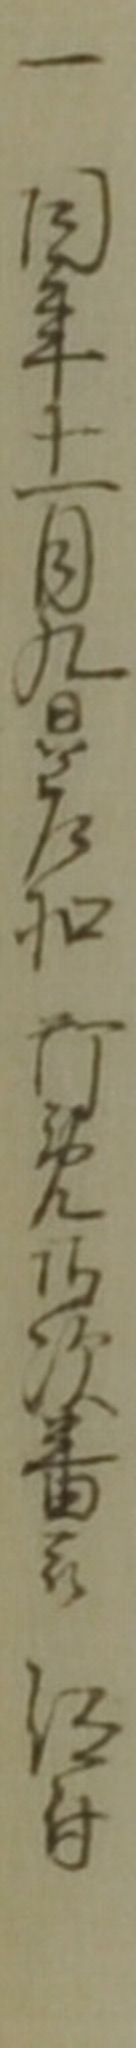一同年十一月九日差控御免御次番被仰付
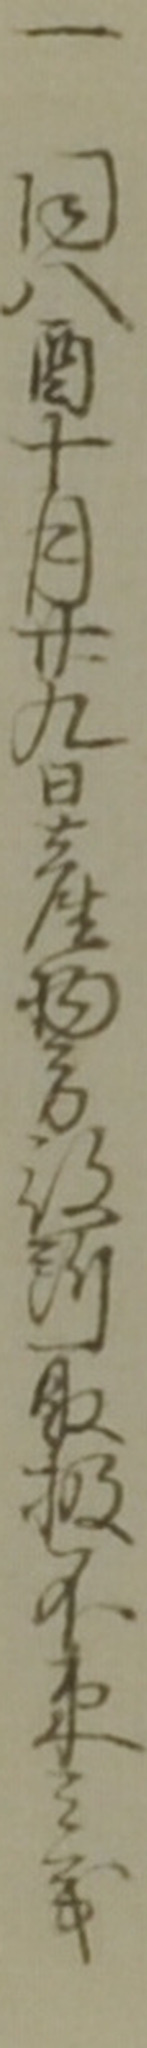一同八酉十月廿九日産物方役所取扱不束之義
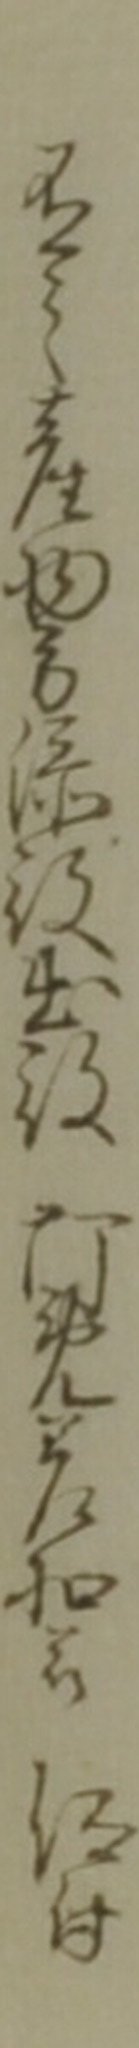有之産物方添役出役御免差控被仰付
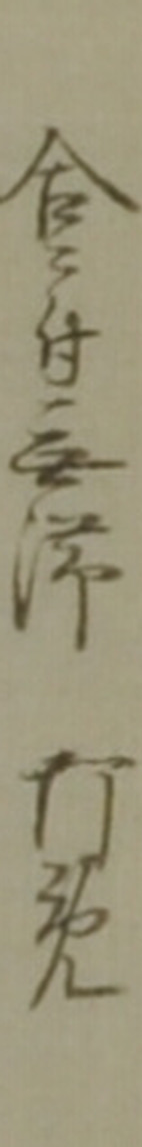合ニ付無滞御免
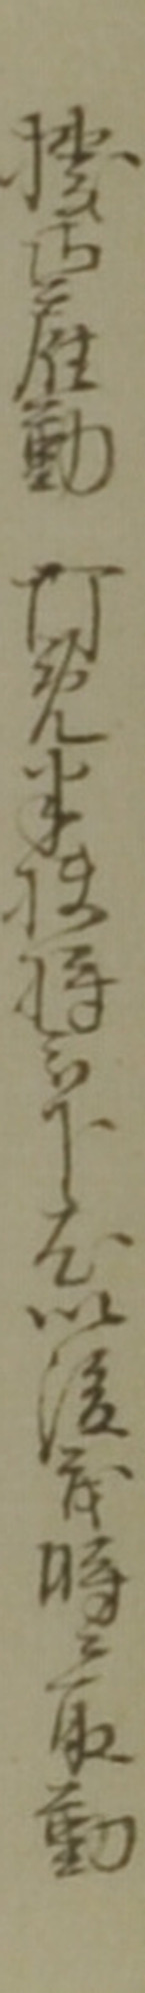拠御雇勤御免半扶持被下尤以後茂時ニ取勤

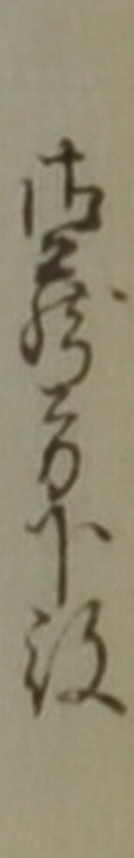御蔵方下役
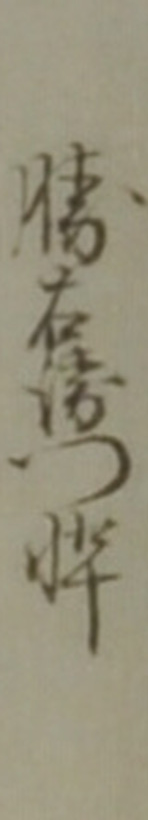勝右衛門忰
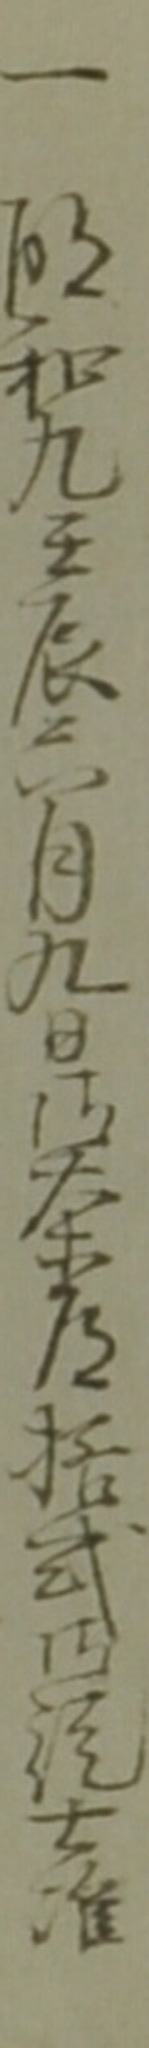一明和九壬辰六月九日御茶道格式御徒士准
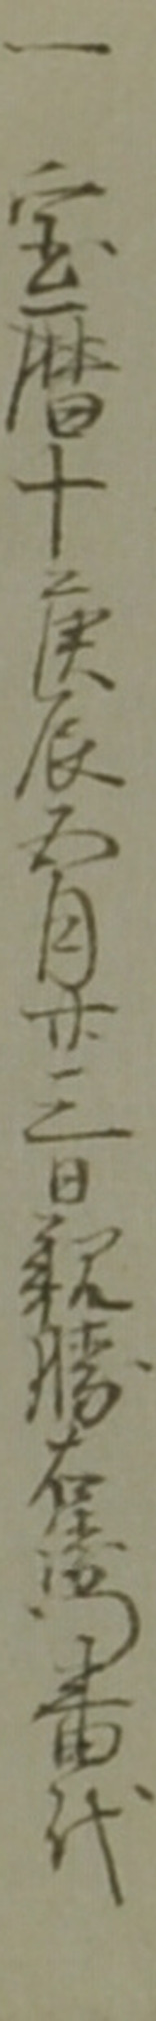一宝暦十庚辰五月廿三日親勝右衛門番代
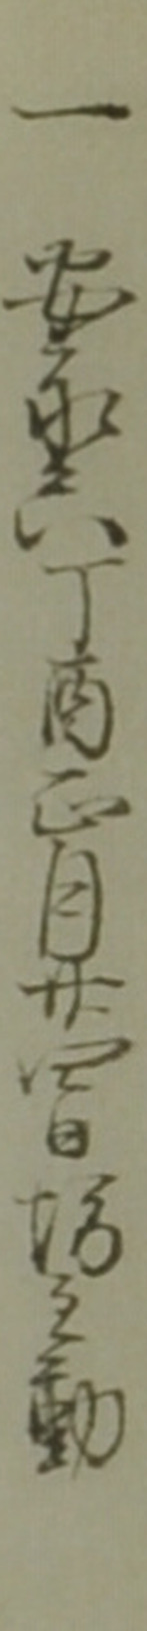一安永六丁酉正月廿四日坊主勤
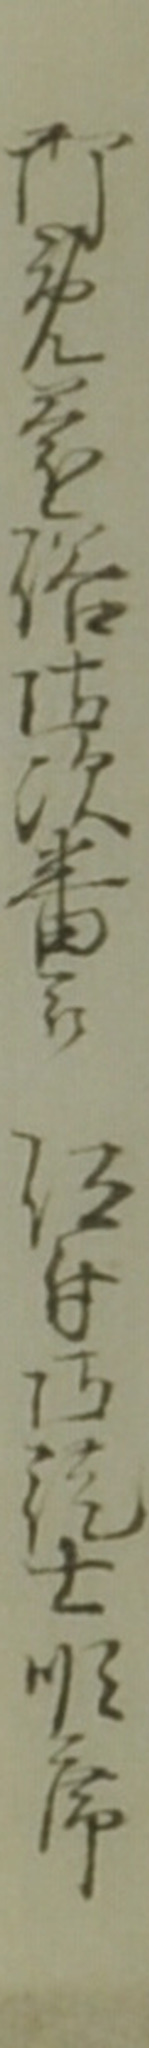御免還俗御次番被仰付御徒士順席
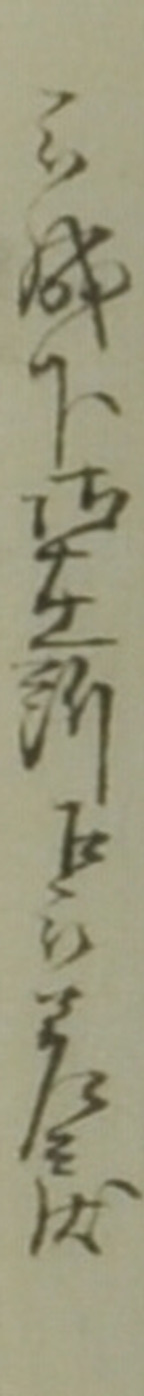被成下御在所江被差戻

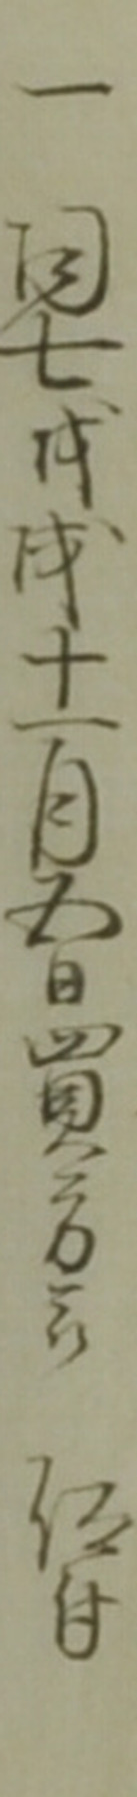一同七戊戌十一月五日買方被仰付
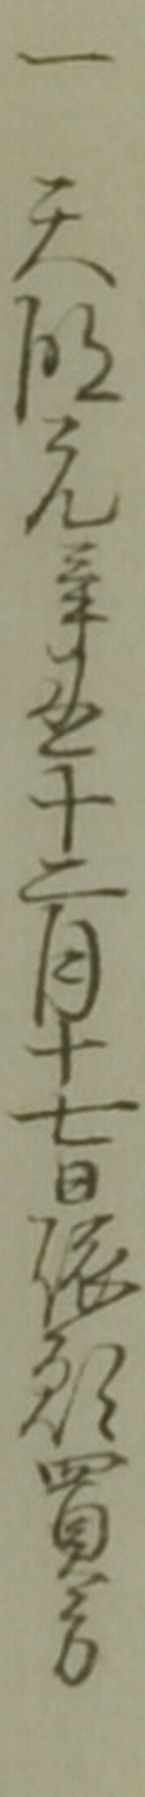一天明元辛丑十二月十七日依願買方
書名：無足諸士勤仕録（五）
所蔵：伊那市立高遠町図書館・合同会社AMANE
